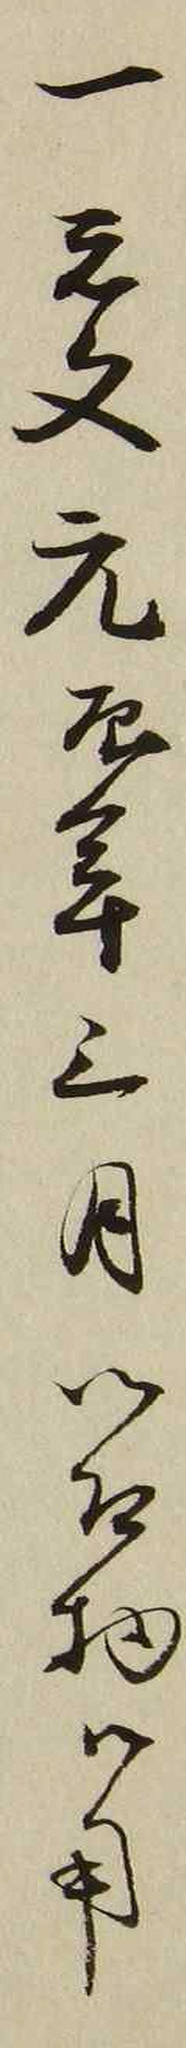一元文元辰三月御召物御用
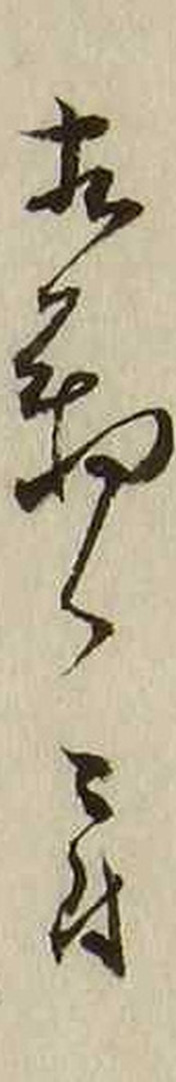相勤候に付
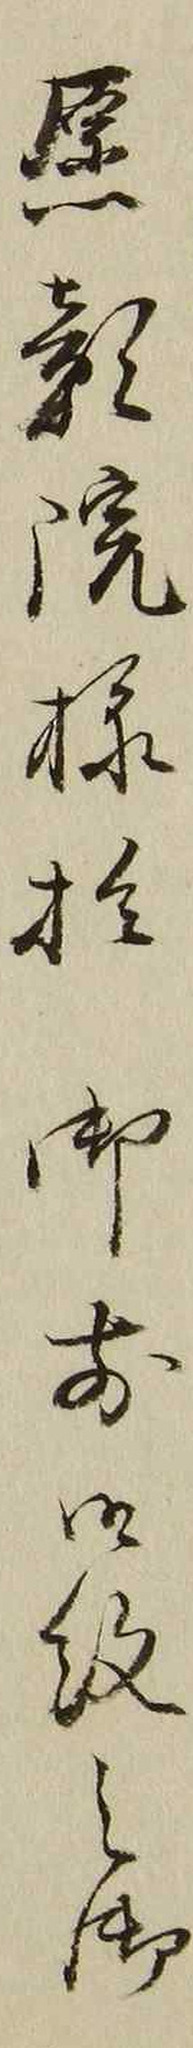愿顔院様於御前御紋之御
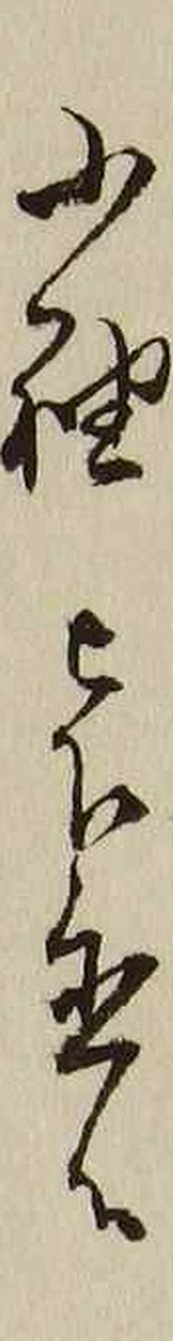小袖被下置候
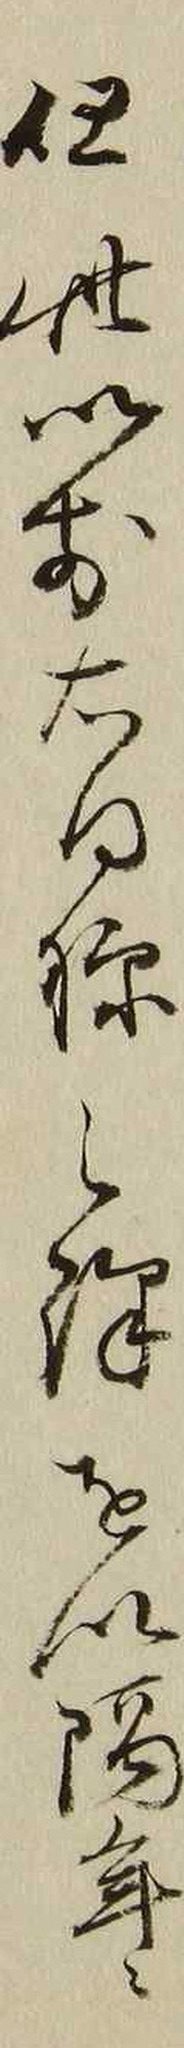但此以前右同弾之譯を以隔年に
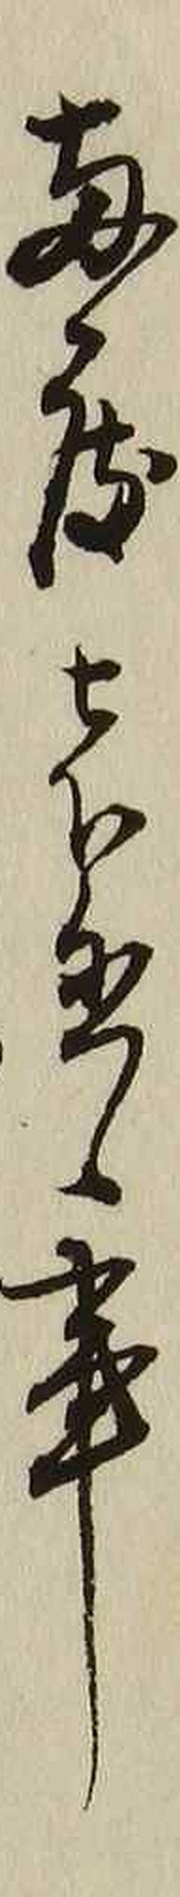両度被下置候事御
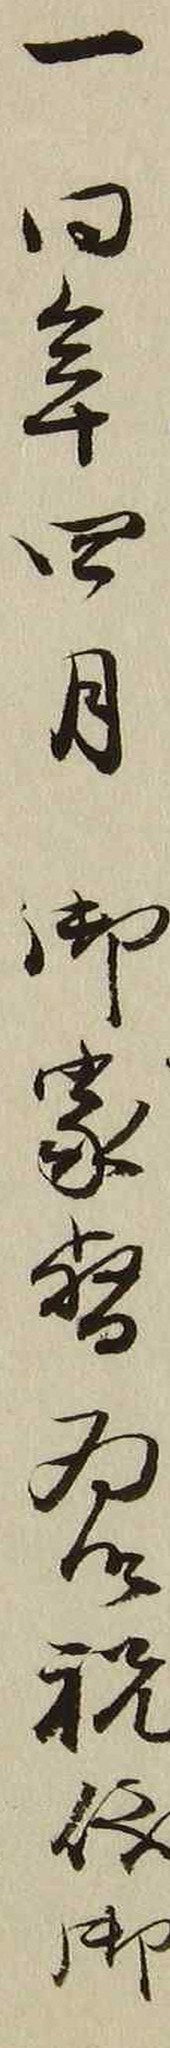一同年四月御家督為御祝儀
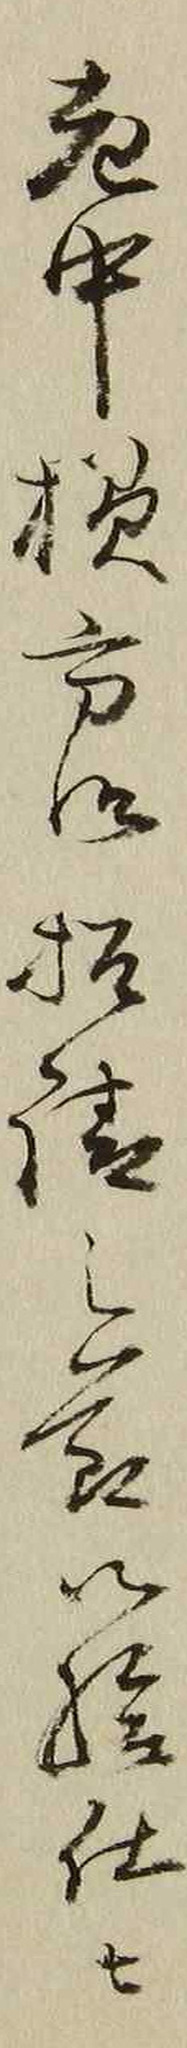老中様方御招請之節御給仕被
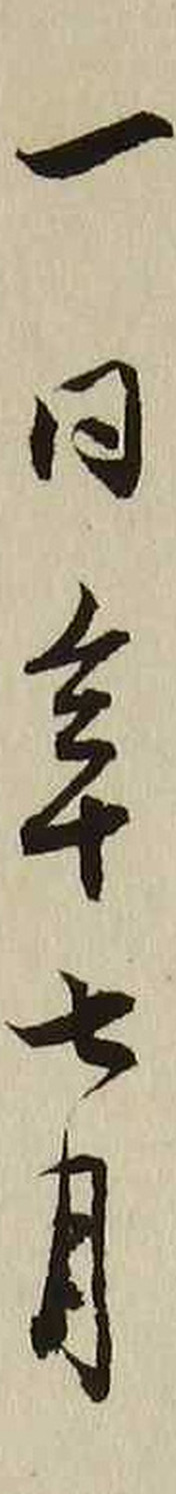一同年七月
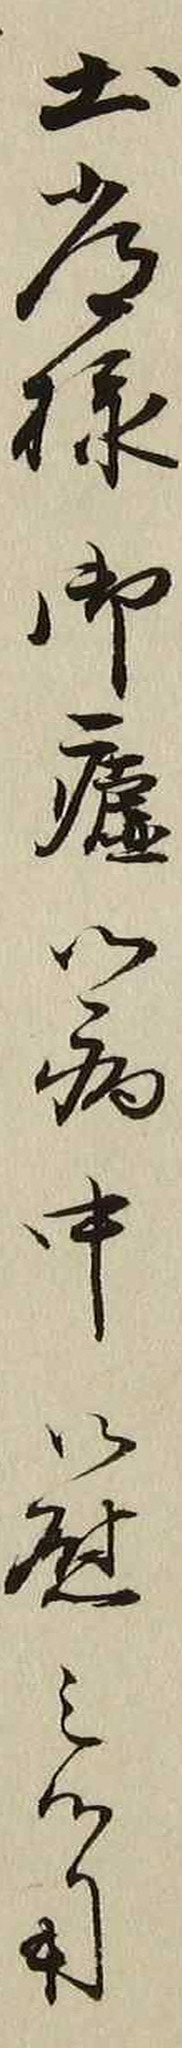土常様御痖御病中御慰之御用
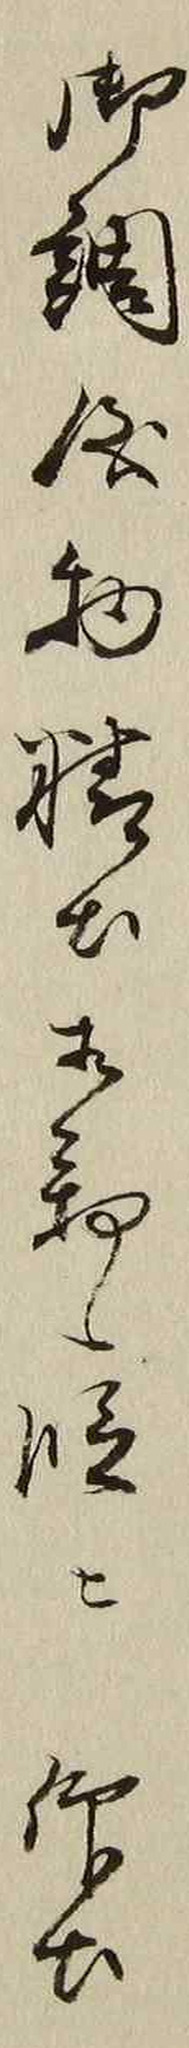御調儀物精出相勤候段被出
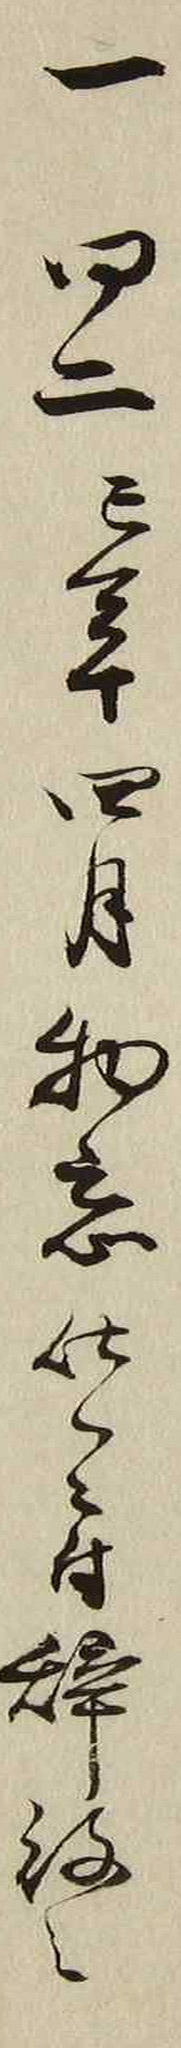一同二巳年四月物忘仕候に付辞役之
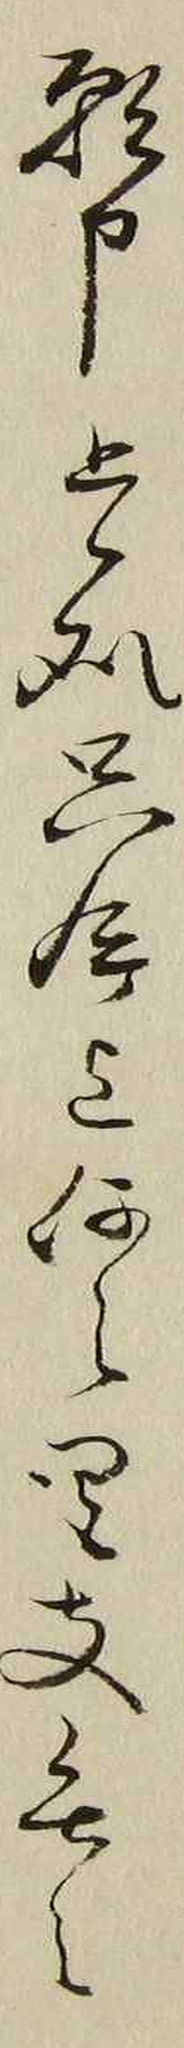願申上候処只今迄何之門も支無之
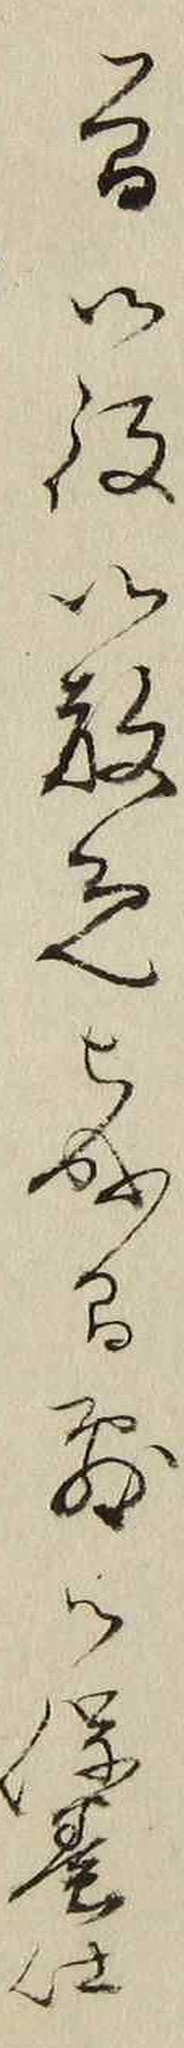候間御役御赦免被成間敷御保養仕
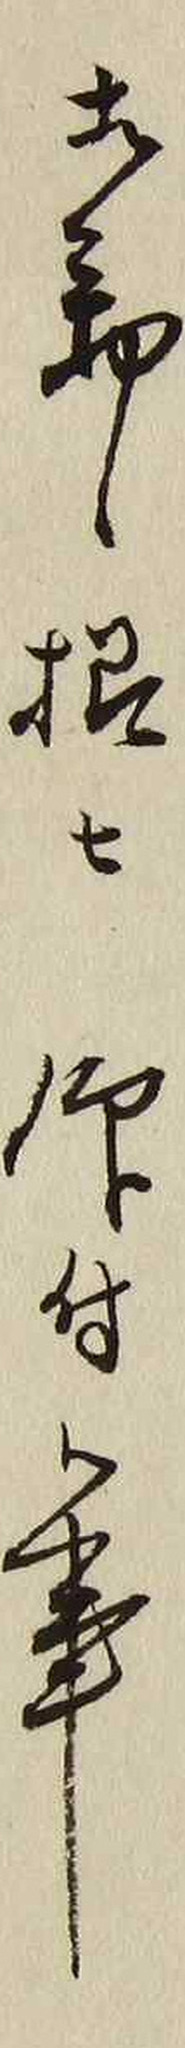相勤候様被仰付候事
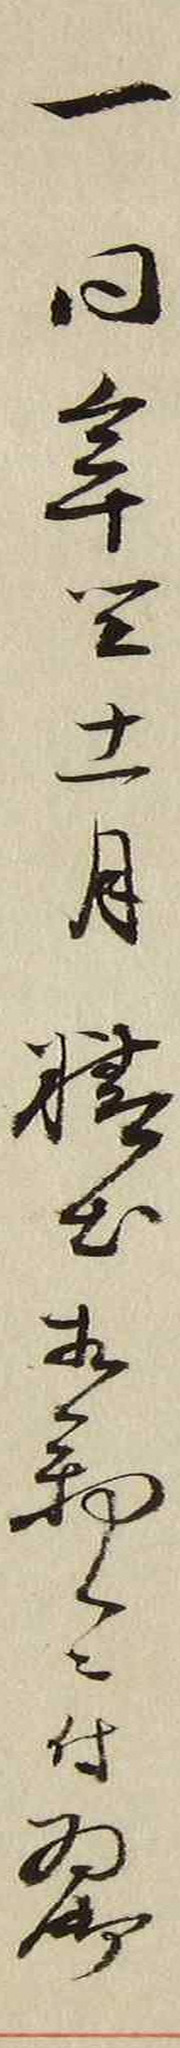一同年閏十一月精出相勤候に付為御
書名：諸士系譜　巻之292　き之部1
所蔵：会津若松市立会津図書館
